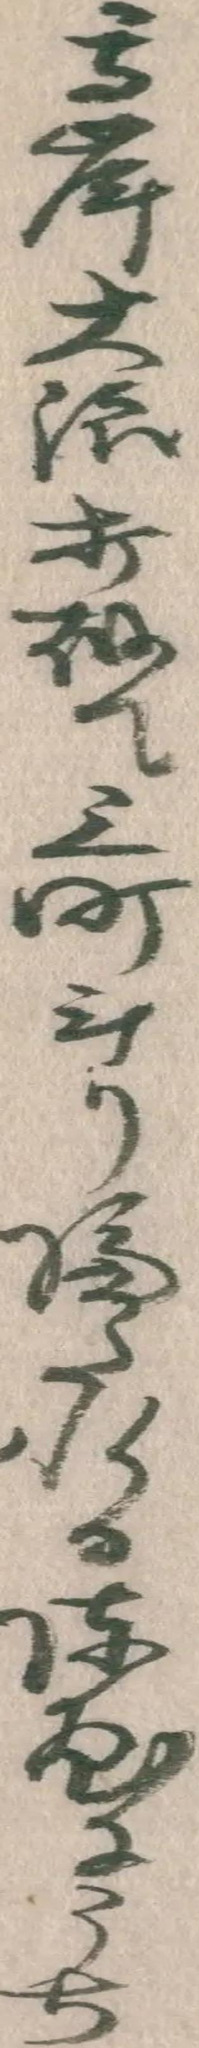高岸大浪打越て三町計り隔たれる陣屋にうち
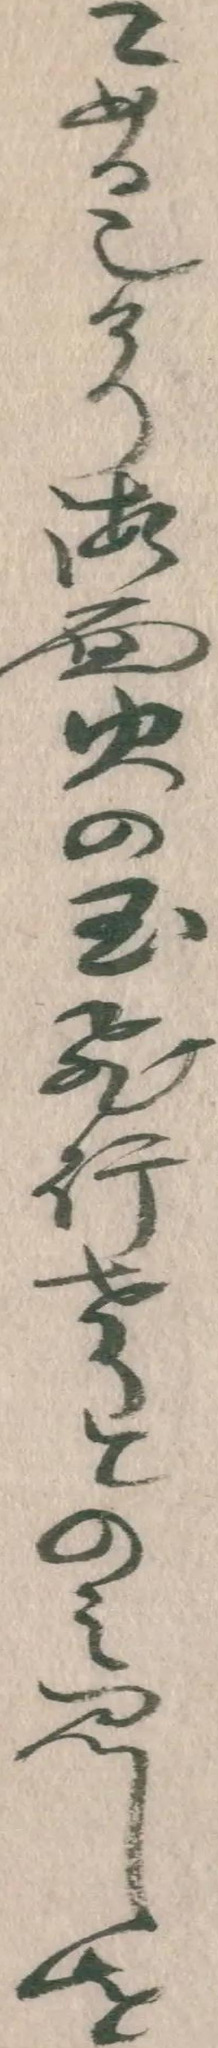こめる也けり海面火の玉飛行せりとのみ見しを
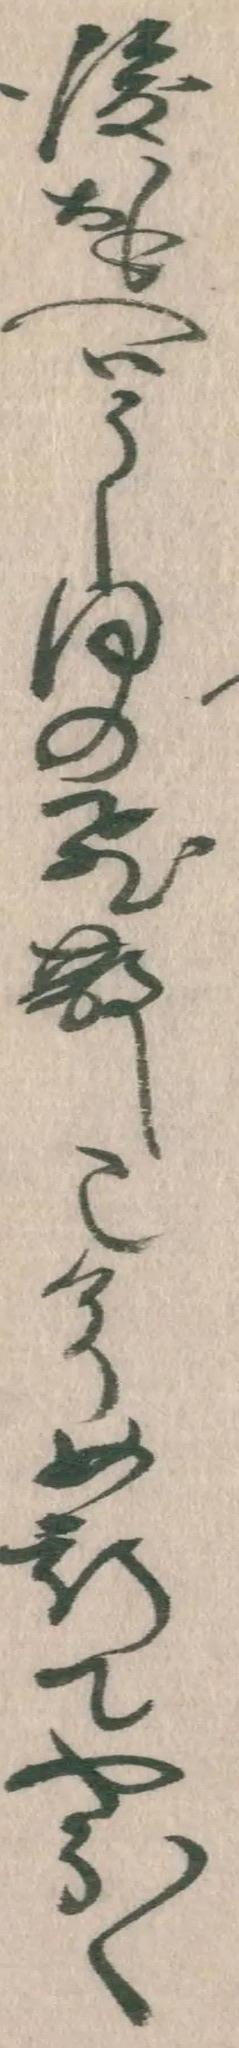後おもへはうしほの飛散し也けり如斯てやう〳〵
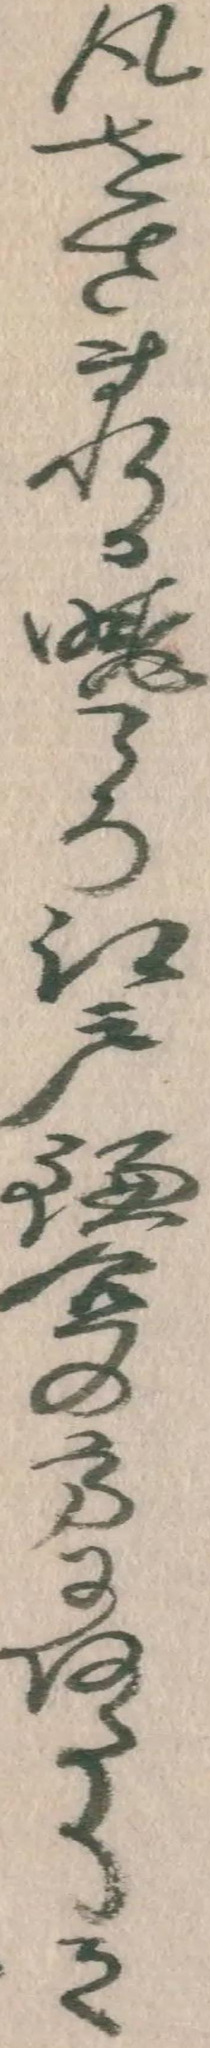風をさまれる暁ころ江戸鎌倉の方にあたりて
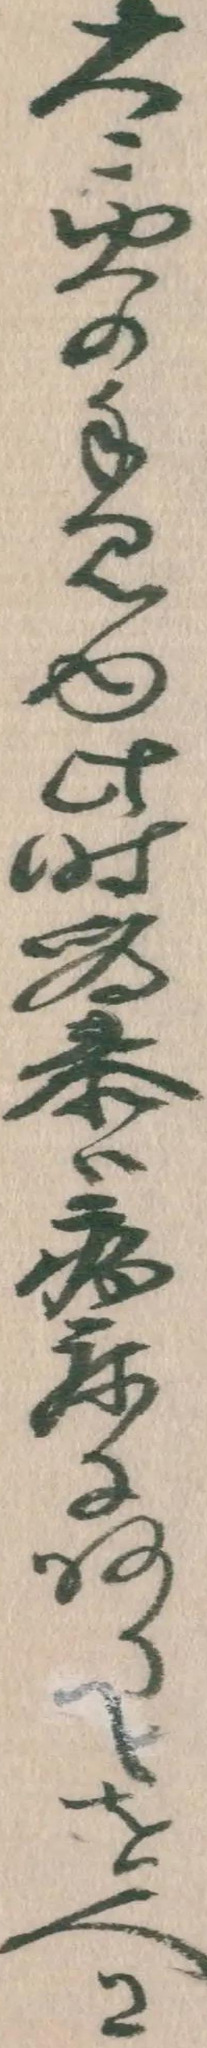大に火の手見ゆ此時為泰は病床にありしを人に
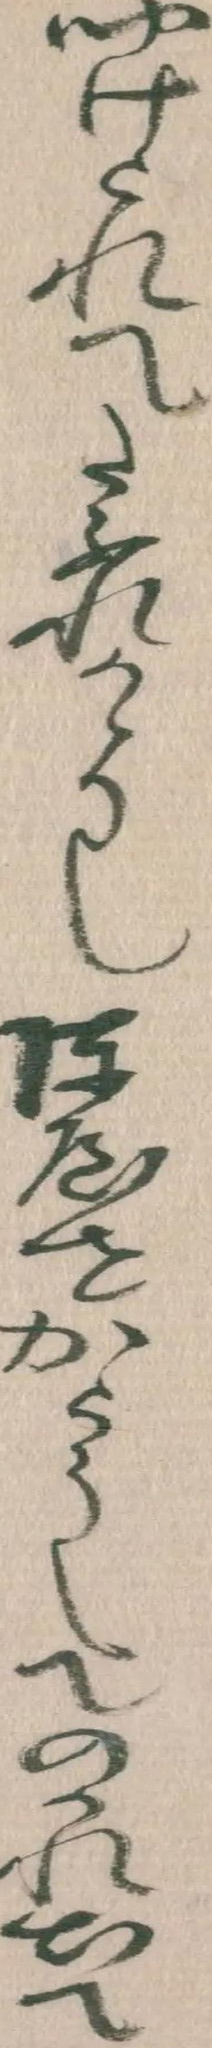助けられてたふれかゝりし陣屋をからうしてのかれ出て
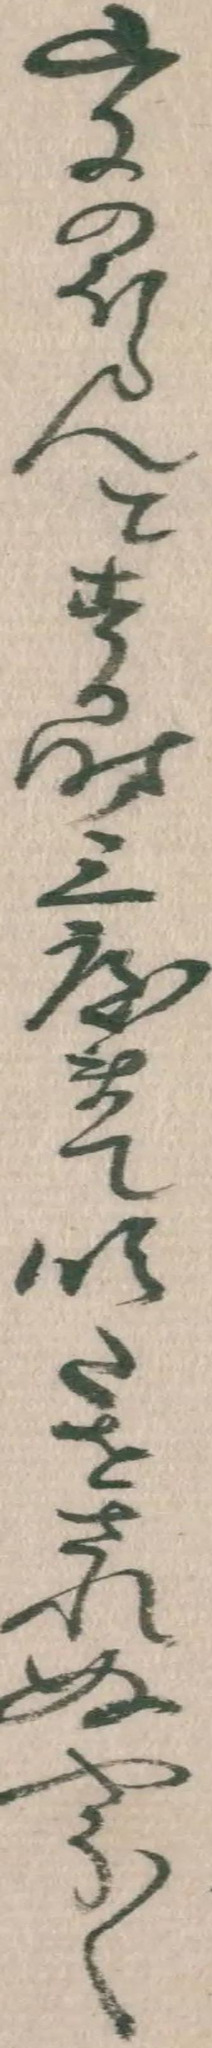山にのほらんとする時三度まて吹たをされぬやう〳〵
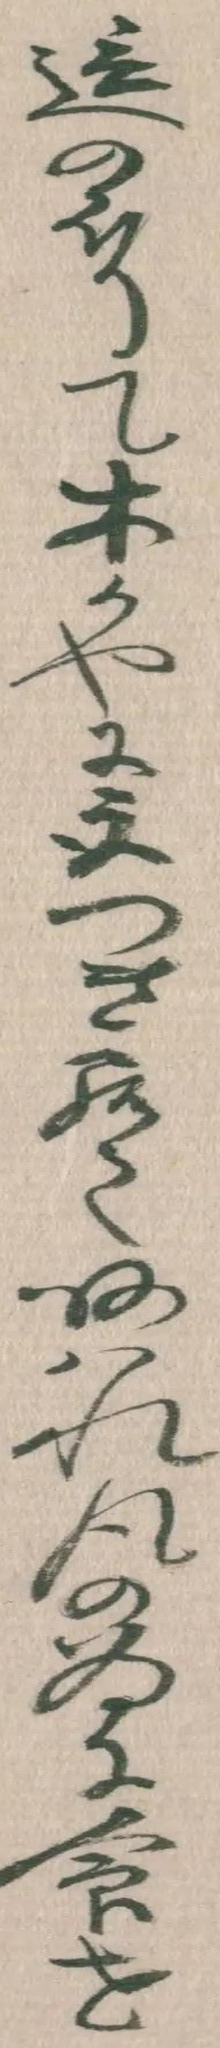這のほりて木かやに取つき居てあはれ風の為に命せ
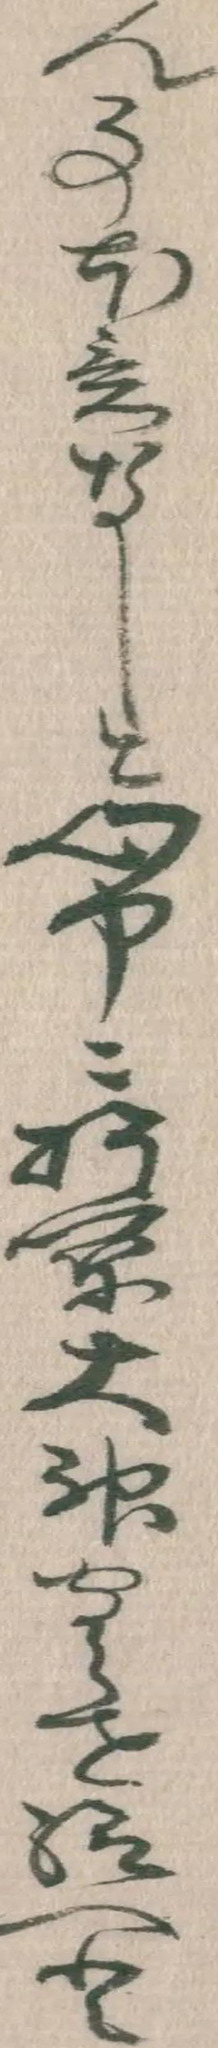ん事本意なしと心中に杵築大神守らせ給へと
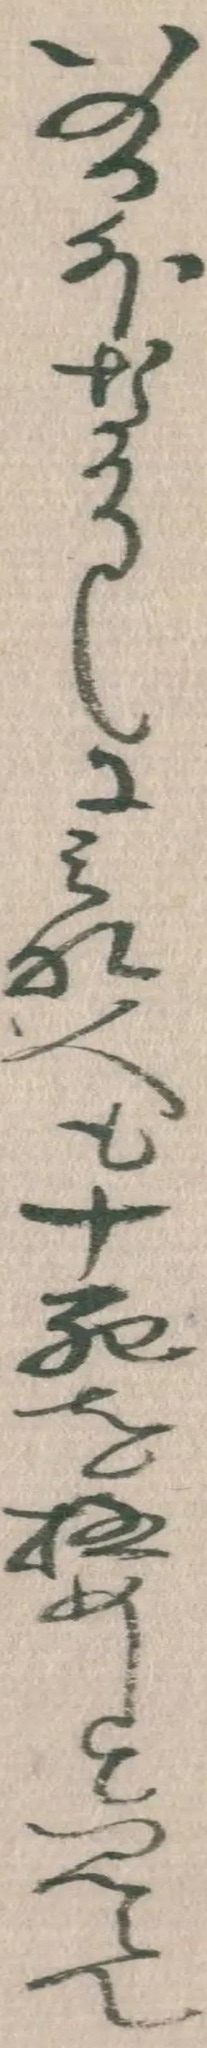いのる外なかりしにみな人も十死を極めしと見へて
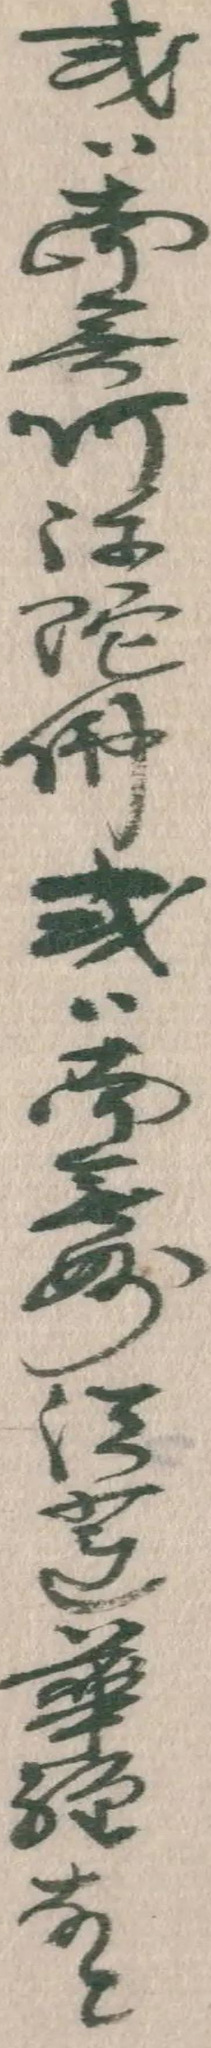或は南無阿弥陀仏或は南無妙法蓮華経なと
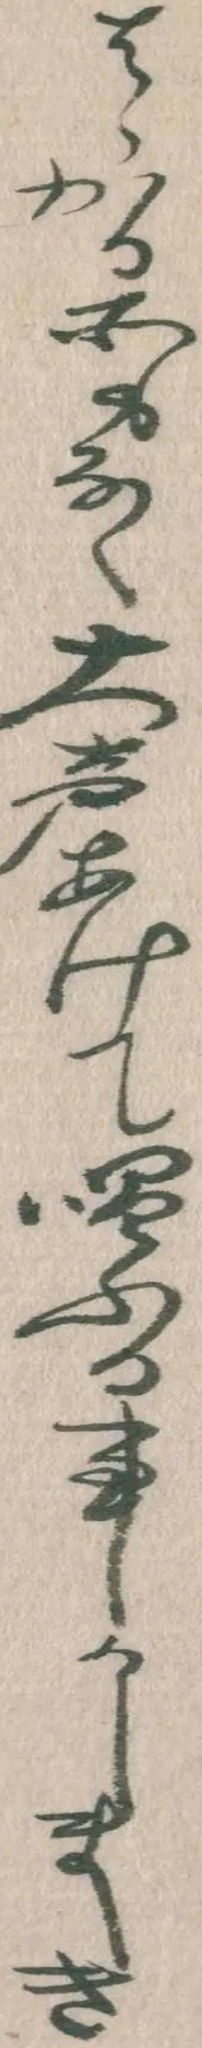はゝかる所もなく大声あけて唱ふる事かしましき
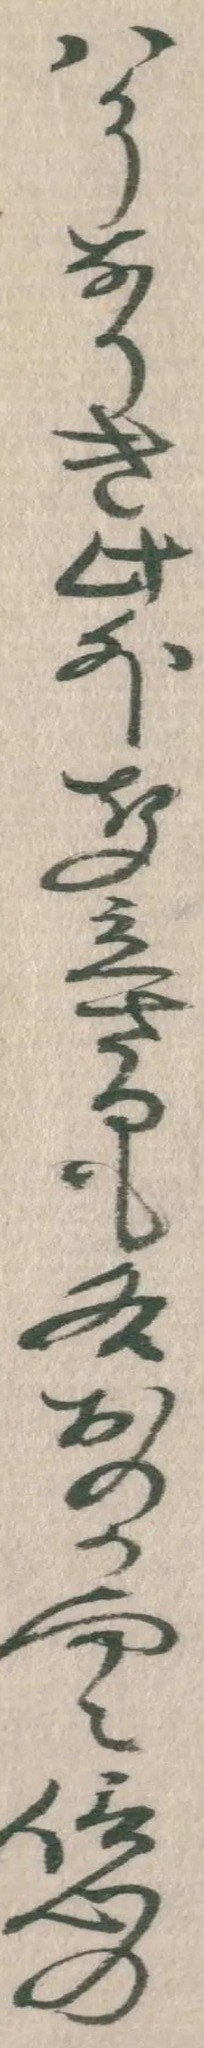はかりなりき此外声立さるも各おのか向々信心の
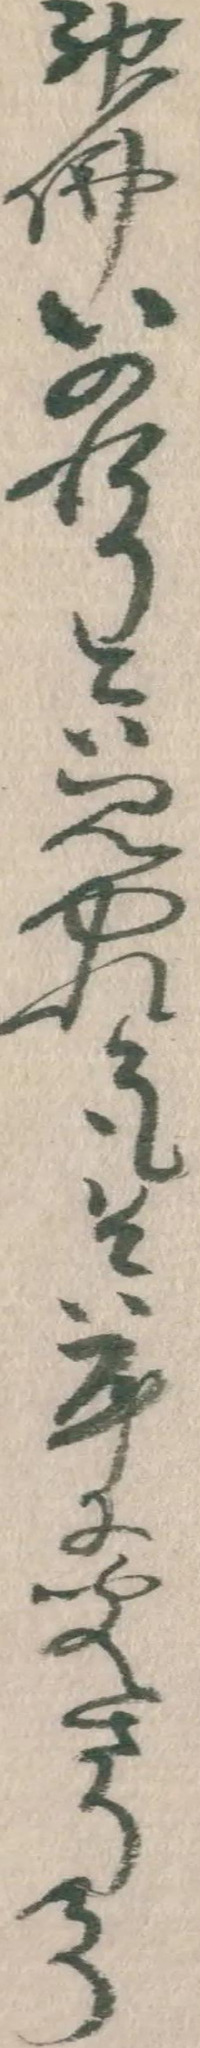神仏いのれりとは見ゆれともそは耳に聞さりけり
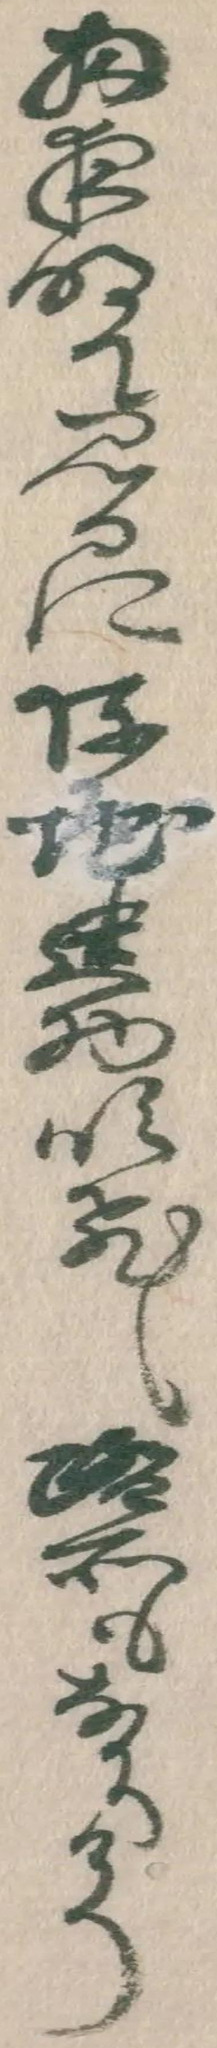扨夜明て見るに陣地建物吹飛し踏所もなかりけり

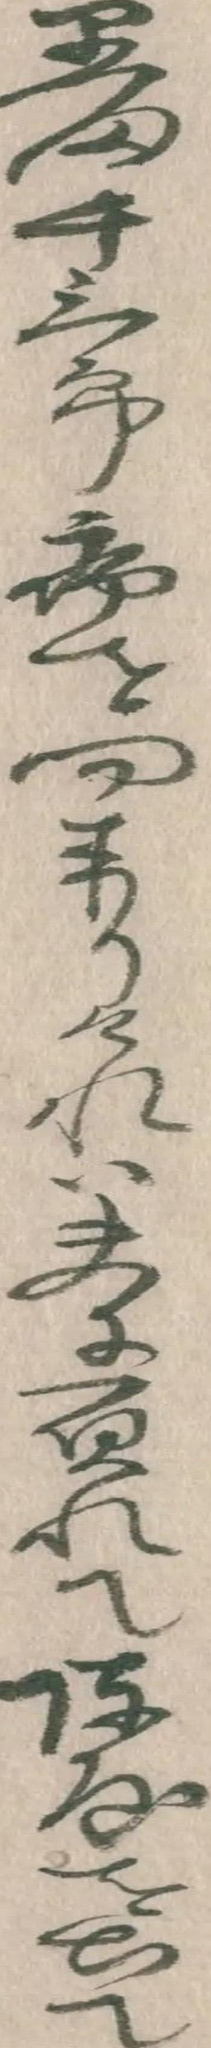黒田千三郎病を問来けれは夫に負れて陣屋を出て
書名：出雲紀行. 20
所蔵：国立国会図書館 National Diet Library, JAPAN
